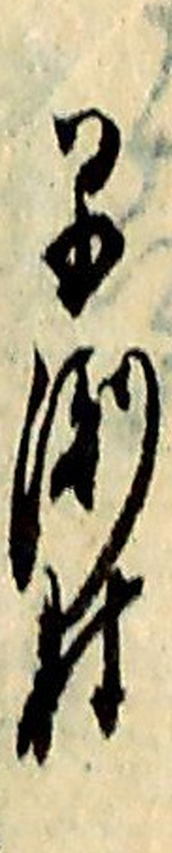早淵村
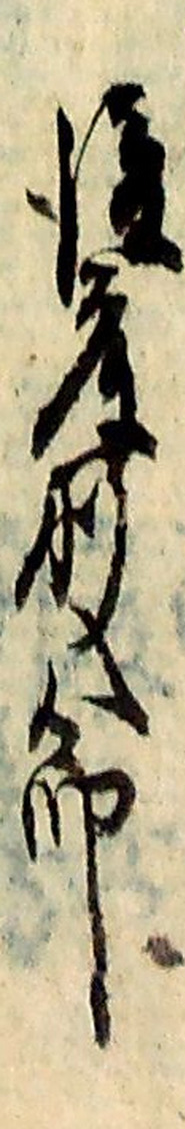後藤利八郎
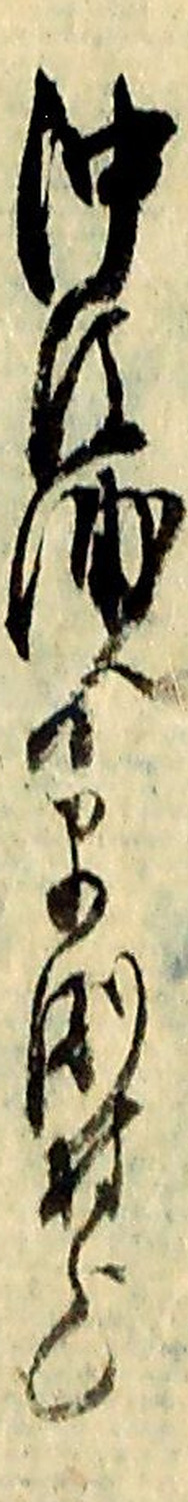沖須浦ゟ早淵村迄
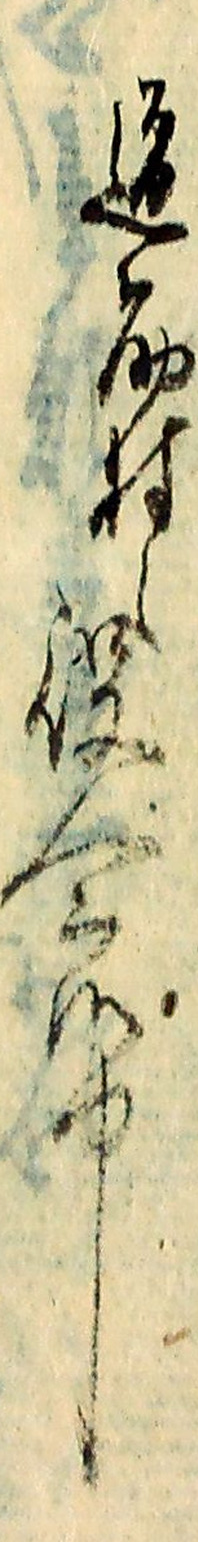道筋村々役人衆中
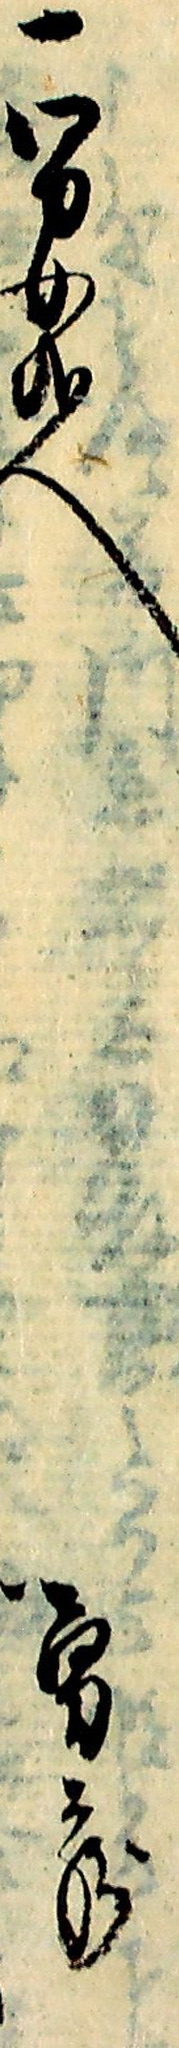一男女弐人勇蔵
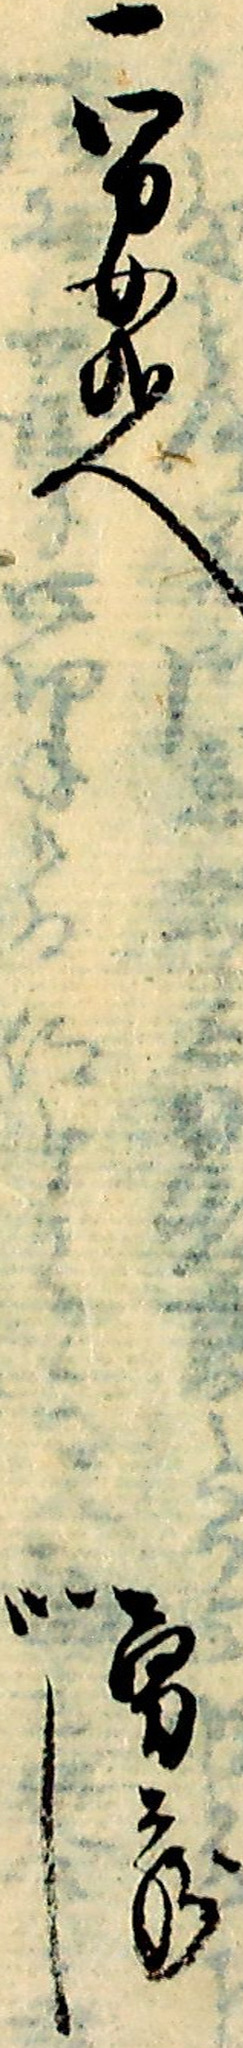一男女弐人勇蔵
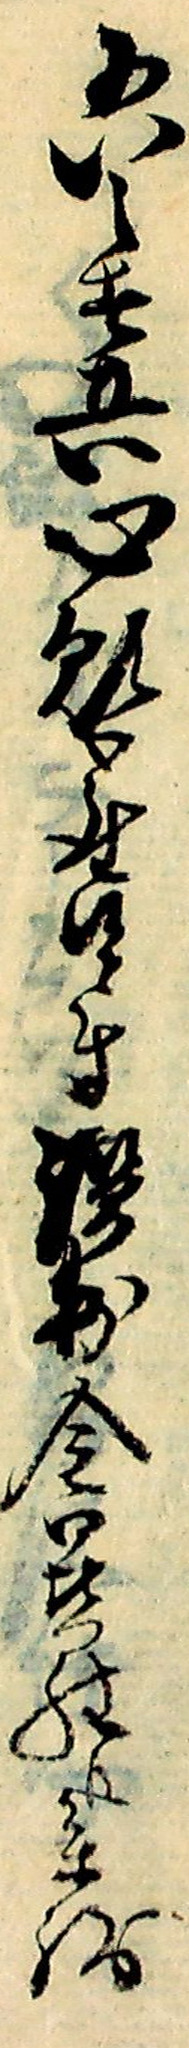右之者共心願御座候に付讃州金毘羅え参詣
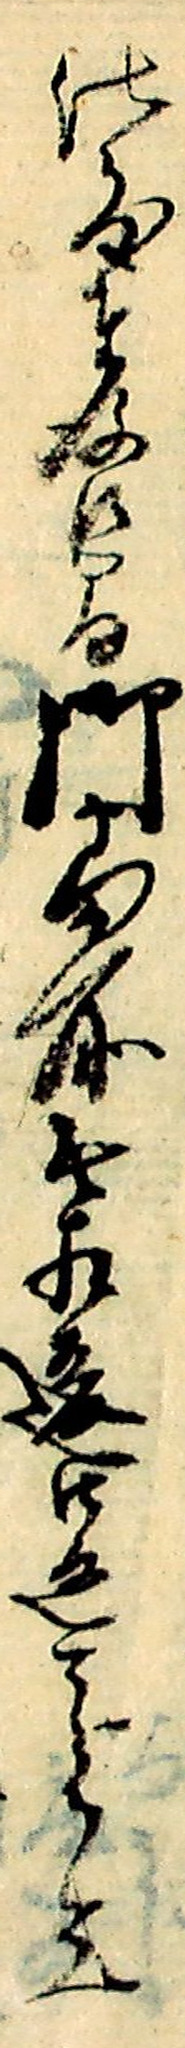仕度奉存候間御番所無相違御通可被下候以上
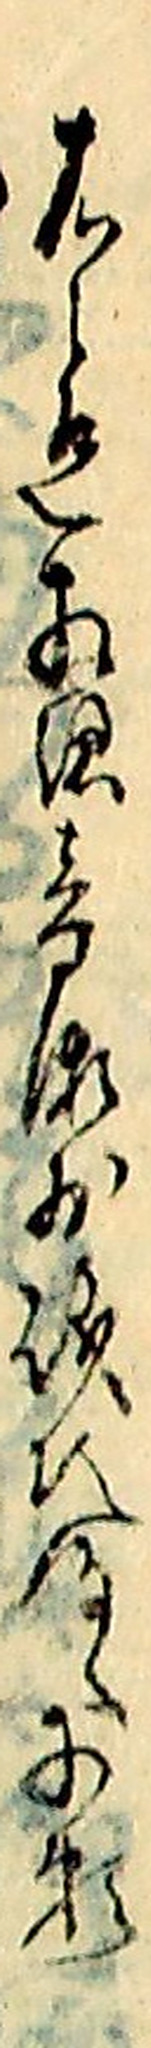右之通相認高瀬村磯次殿へ相頼藤蔵
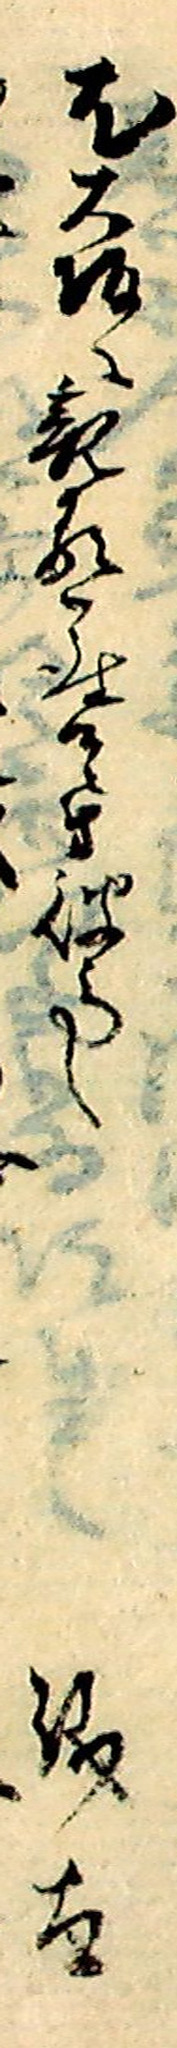尤大坂に親類御座候に付彼方へ利兵衛
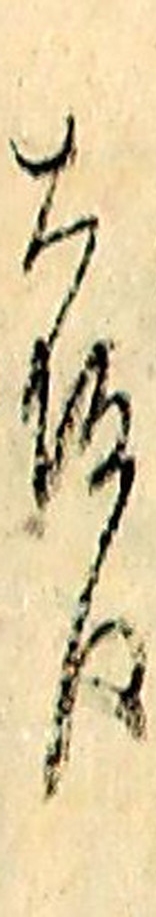大坂口
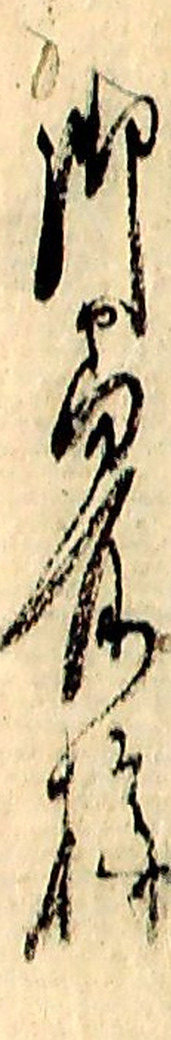御番所様

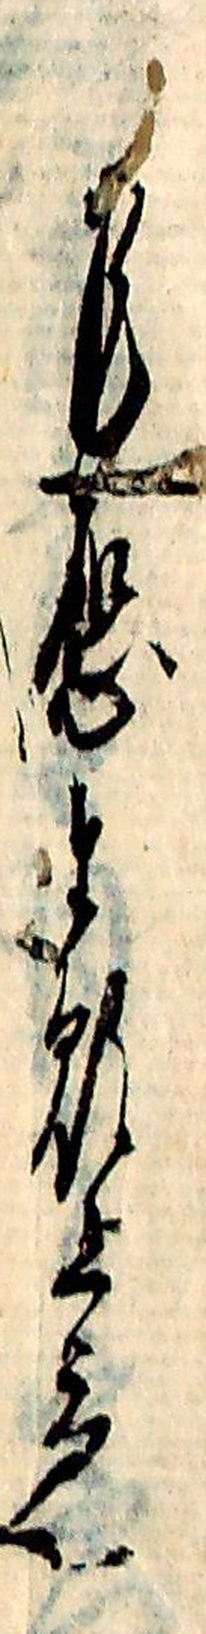乍恐奉願上覚
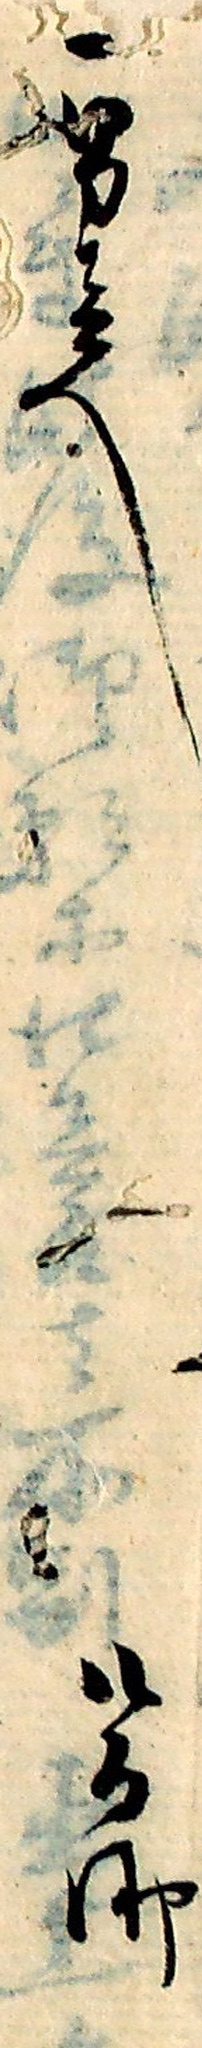一男壱人八百助
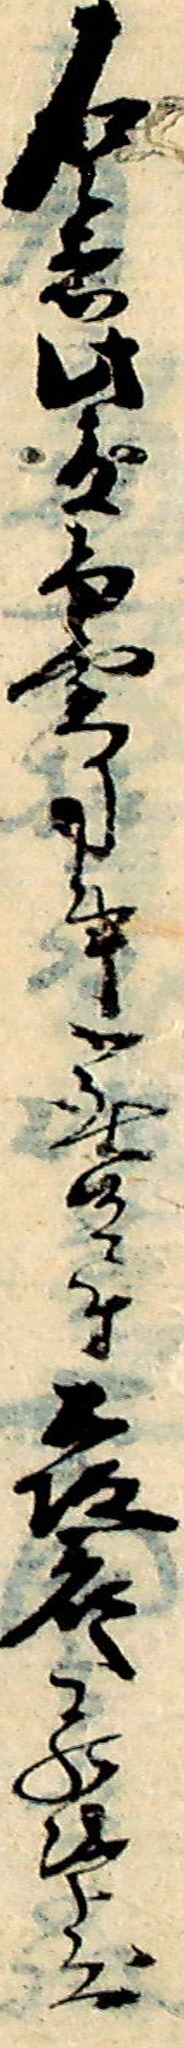右之者此度商売用事御座候に付大坂表へ罷越申度
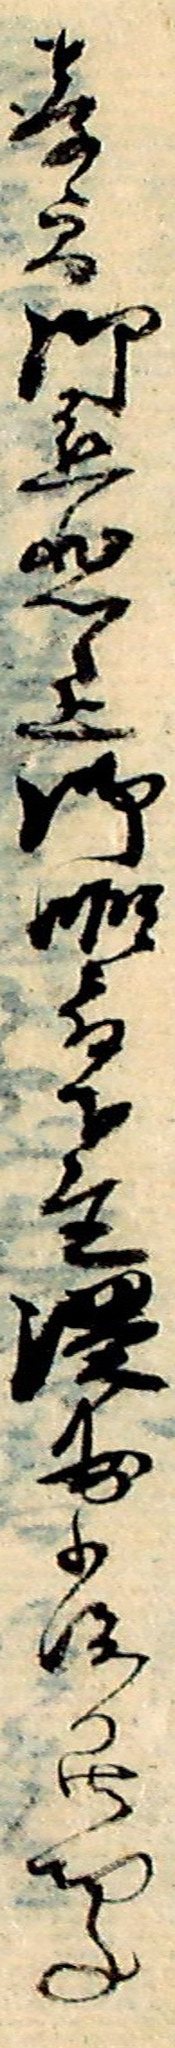奉存候間御慈悲之上御暇被為下置淡州小渡り御切手
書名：諸御願書控(後藤氏壱番）
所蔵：鳴門教育大学 Naruto University of Education
